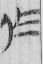於
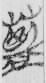藍
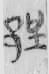郢
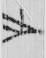之
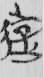遊
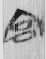宮
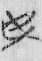○（焉）
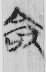命
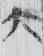大
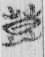莫
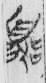囂
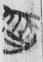○（屈）
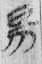昜（陽）
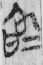爲
